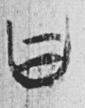曰
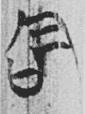含（今）
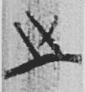之
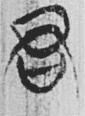君
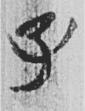子
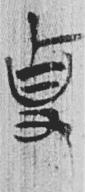○（使）
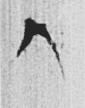人
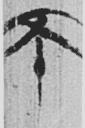不
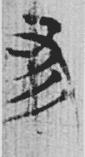○（盡）
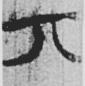亓（其）
